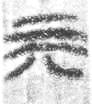而
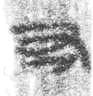君
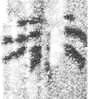天
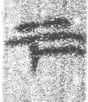下
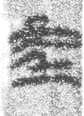○（吾）
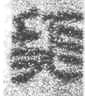○（聞）
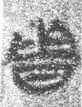周
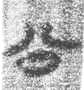公
